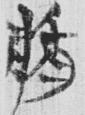○（逸）
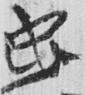𡚦（安）
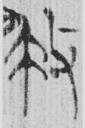救（求）
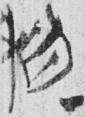利
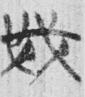戔（殘）
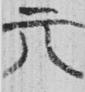亓
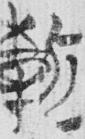新（親）
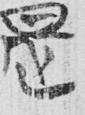是
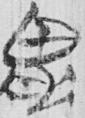{胃刀}（謂）
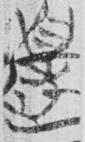○（罪）
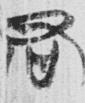君
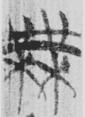無
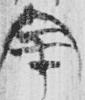宔（主）
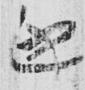臣
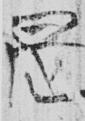是
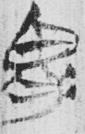{胃刀}（謂）
